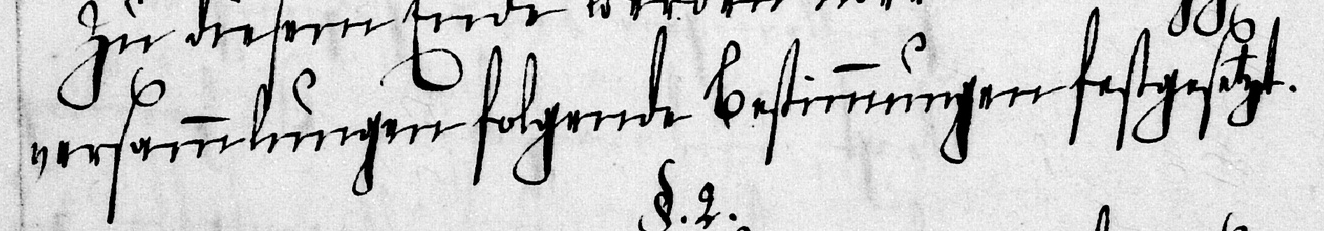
versammlungen folgende Bestimmungen festgeset¬
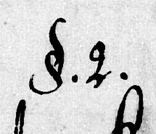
§. 2.
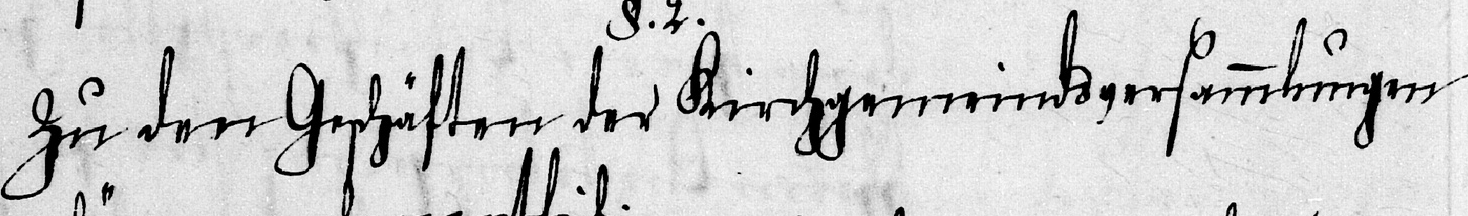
Zu den Geschäften der Kirchgemeindsversammlungen
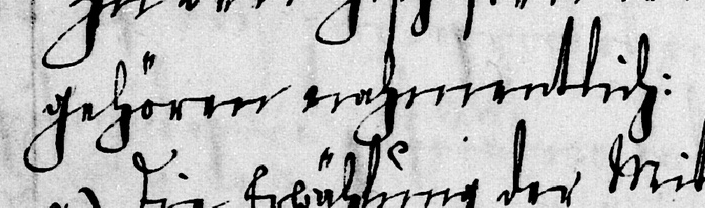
gehören nahmentlich:
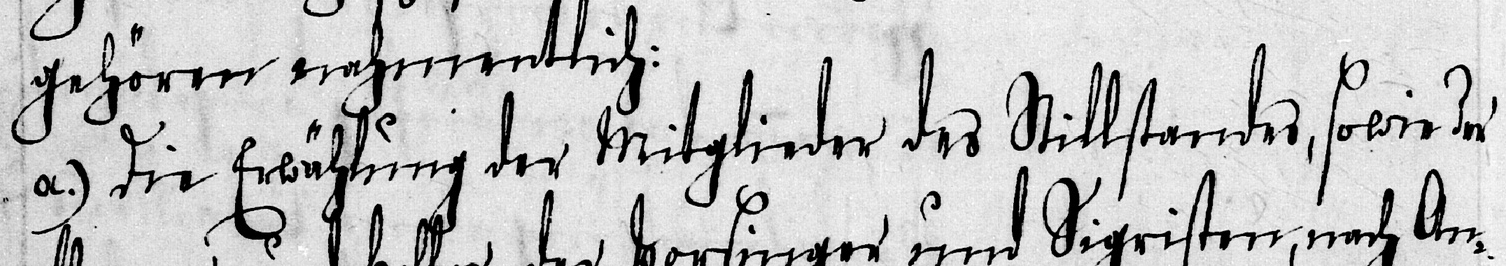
a.) Die Erwählung der Mitglieder des Stillstandes, sowie
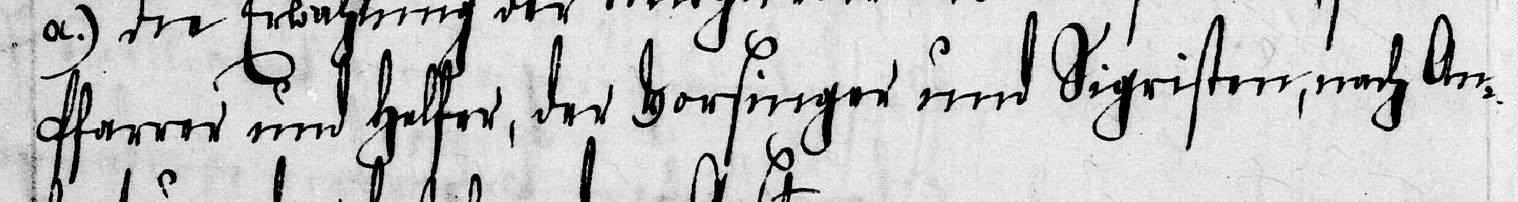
Pfarrer und Helfer, der Vorsinger und Sigristen, nach An¬
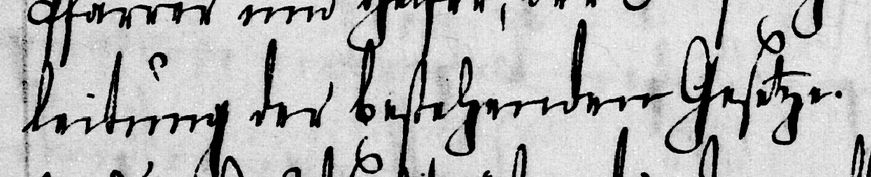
leitung der bestehenden Gesetze.
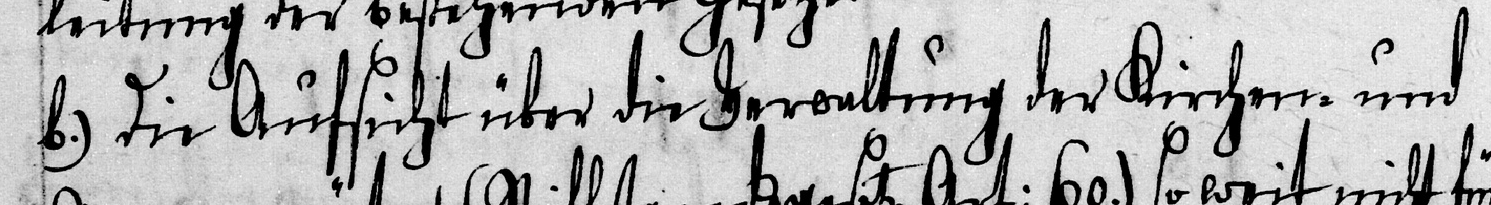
b.) Die Aufsicht über die Verwaltung der Kirchen- und
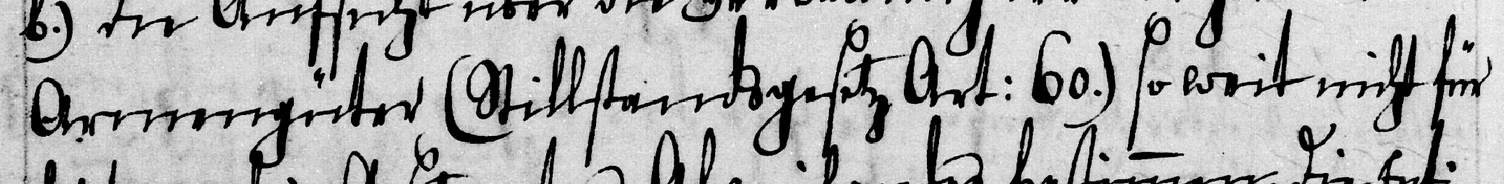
Armengüter (Stillstandsgesetzt Art: 60.) so weit nicht für
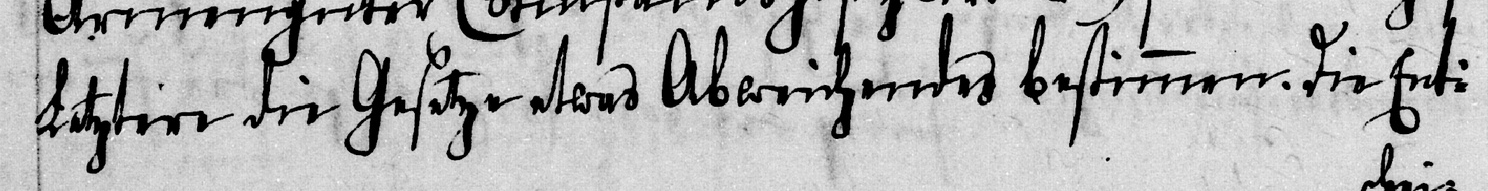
Letztere die Gesetze etwas Abweichendes bestimmen. Die Ent-
